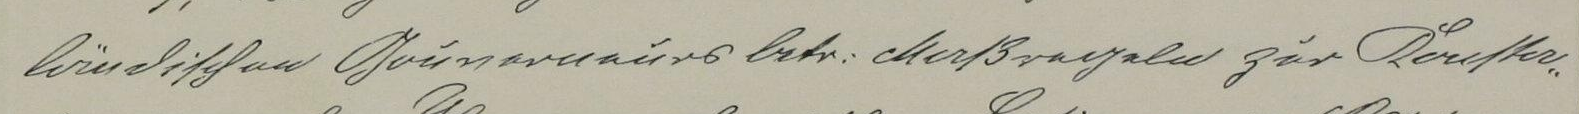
ländischen Gouverneurs betr. Maßregeln zur Konsta-
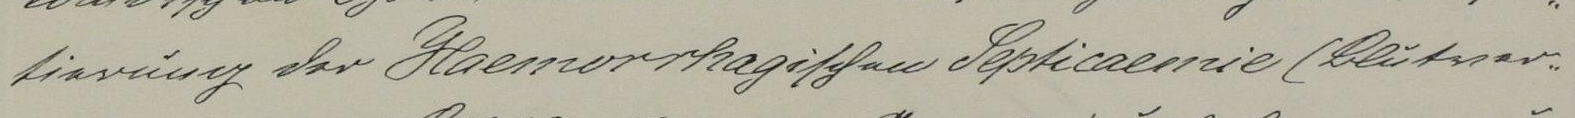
tierung der Haemorrhagischen Septicaemie (Blutver-
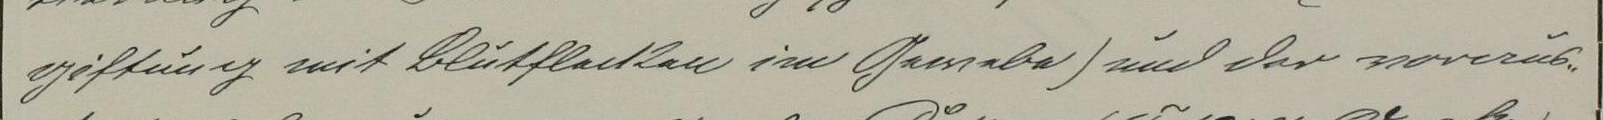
giftung mit Blutflecken im Gewebe) und der voraus-
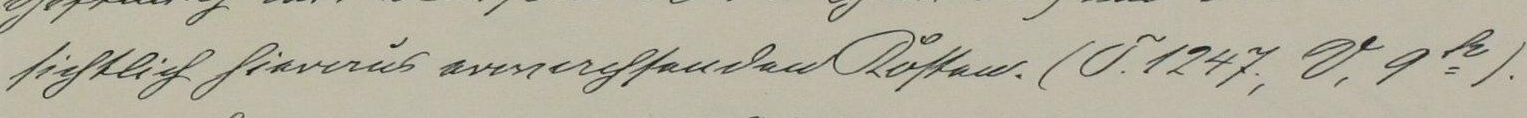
sichtlich hieraus erwachsenden Kosten. (T.1247; V.9h).
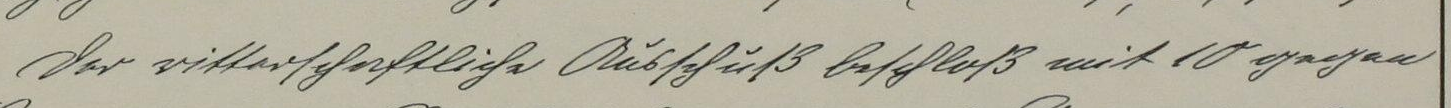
Der ritterschaftliche Ausschuß beschloß mit 10 gegen
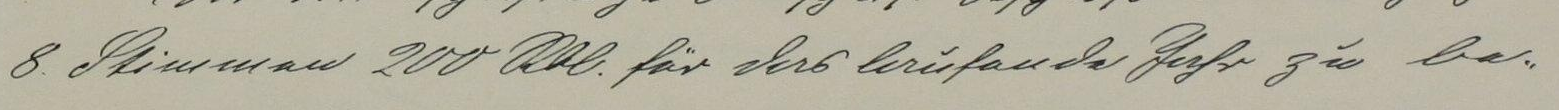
8 Stimmen 200 Rbl. für das laufende Jahr zu be-
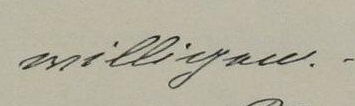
willigen.
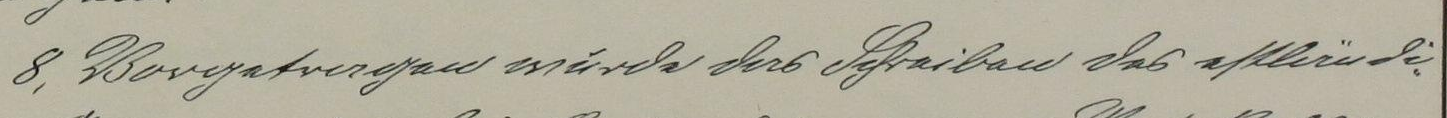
8. Vorgetragen wurde das Schreiben des estländi-
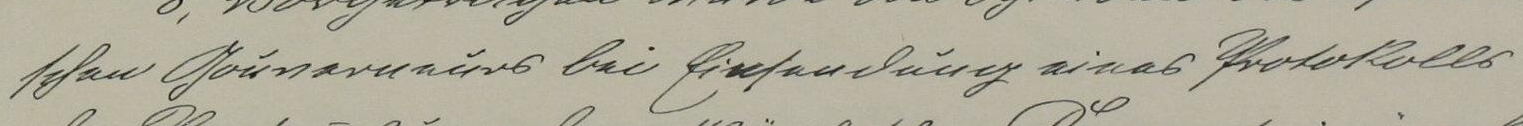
schen Gouverneurs bei Einsendung eines Protokolls
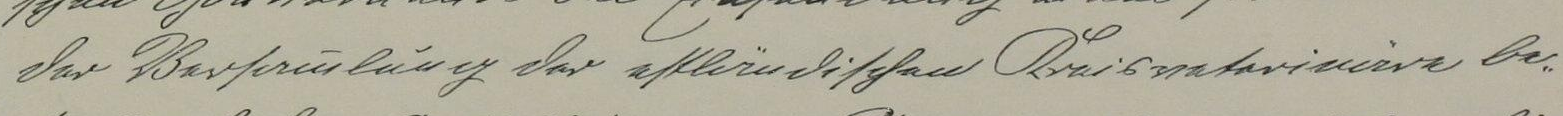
der Versammlung der estländischen Kreisveterinäre be-
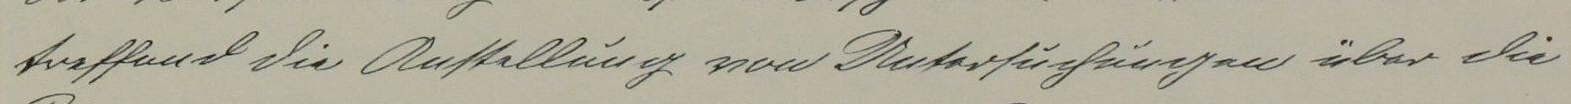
treffend die Anstellung von Untersuchungen über die
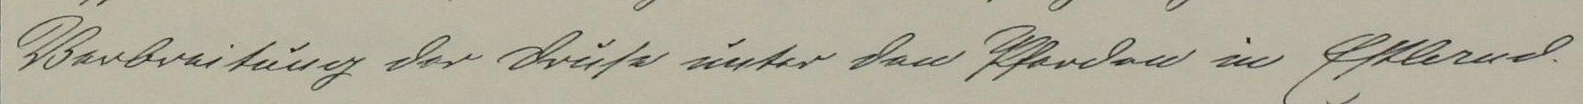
Verbreitung der Druse unter den Pferden in Estland.
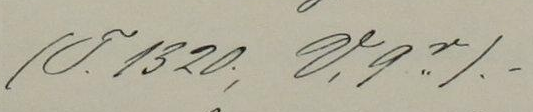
(T.1320; V.9r).
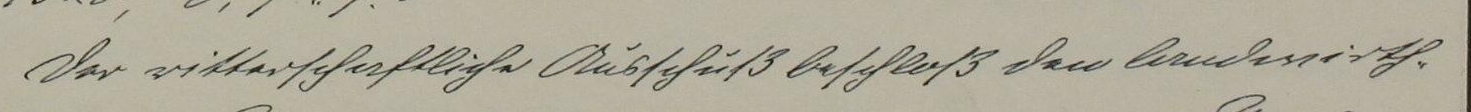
Der ritterschaftliche Ausschuß beschloß den landwirth-
